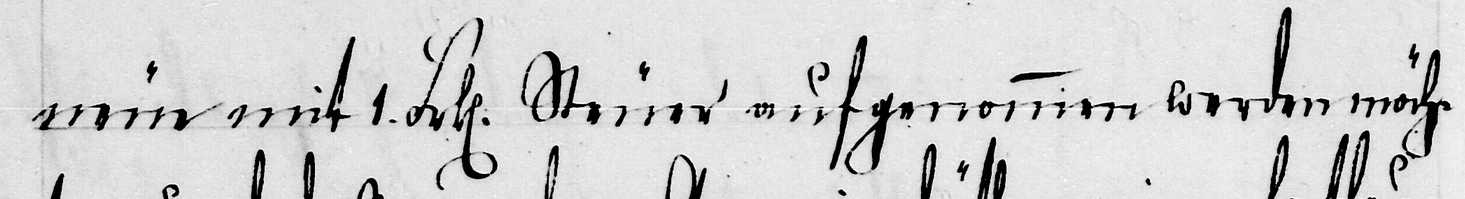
neue mit 1 Frk[en]. Steuer aufgenommen werden möch¬
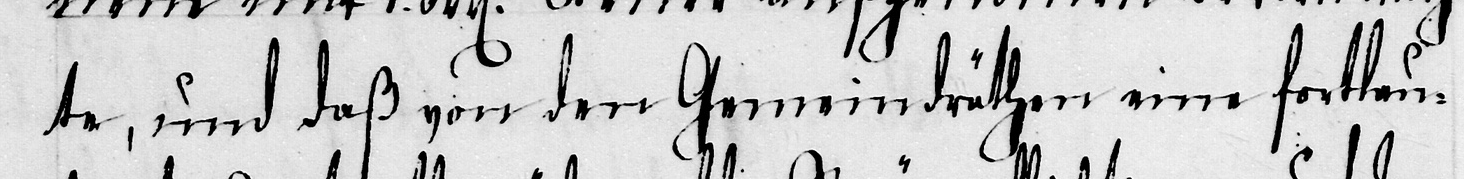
te, und daß von den Gemeindräthen eine fortlau¬
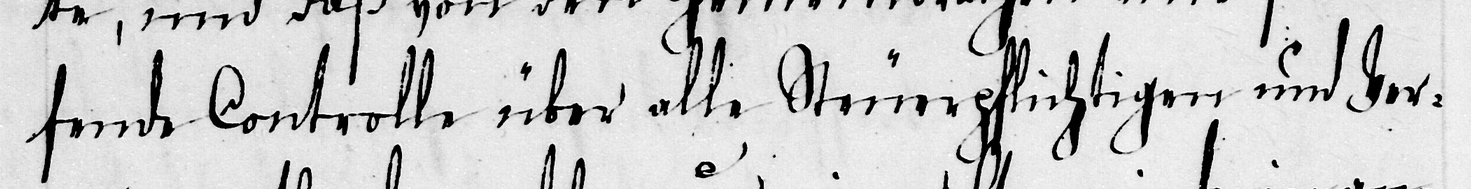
fende Controlle über alle Steuerpflichten und Ver¬
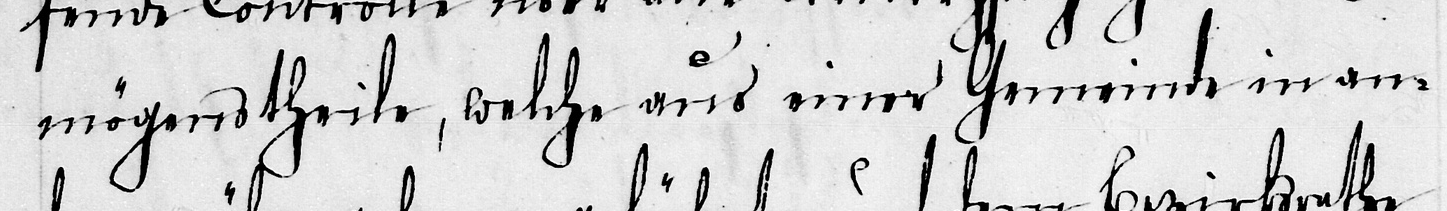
mögenstheile, welche aus einer Gemeinde in an¬
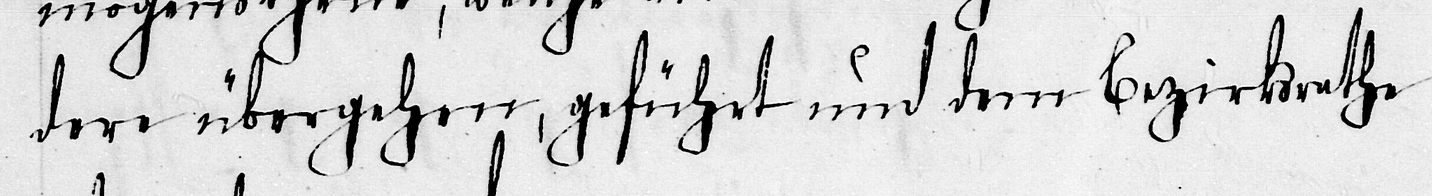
dere übergehen, geführt und dem Bezirksrathe
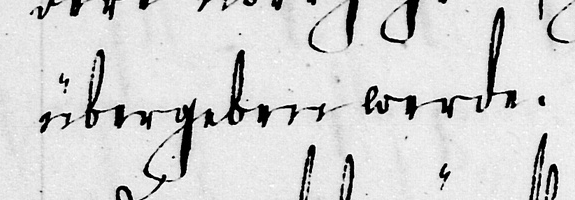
übergeben werde.
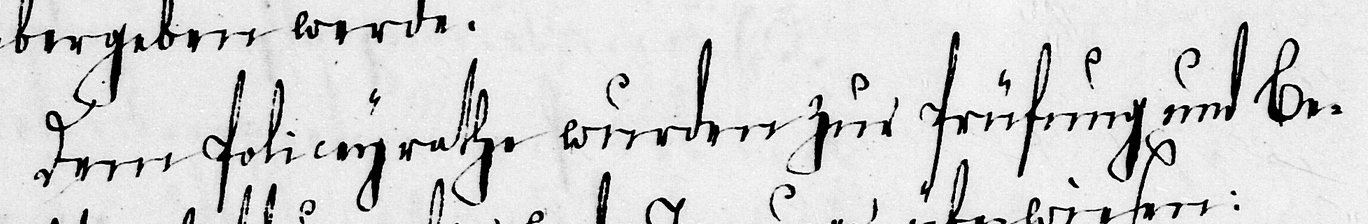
Dem Policeyrathe wurden zur Prüfung und Be¬
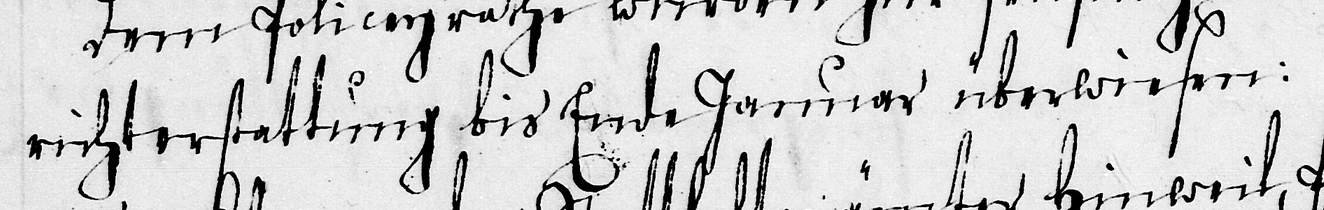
richtserstattung bis Ende Januar überwiesen:
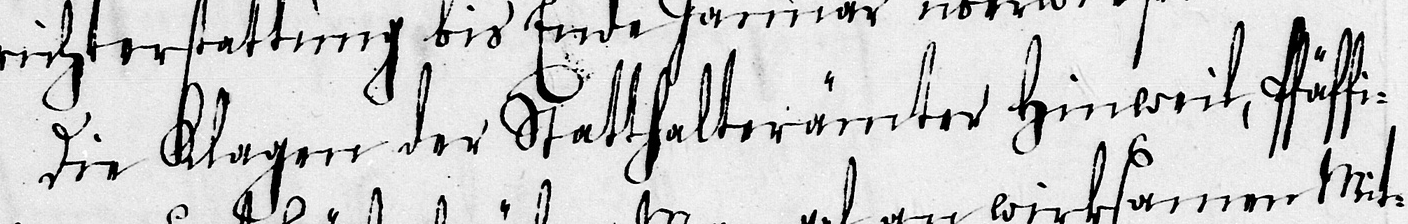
Die Klagen der Statthalterämter Hinweil, Pfäff¬
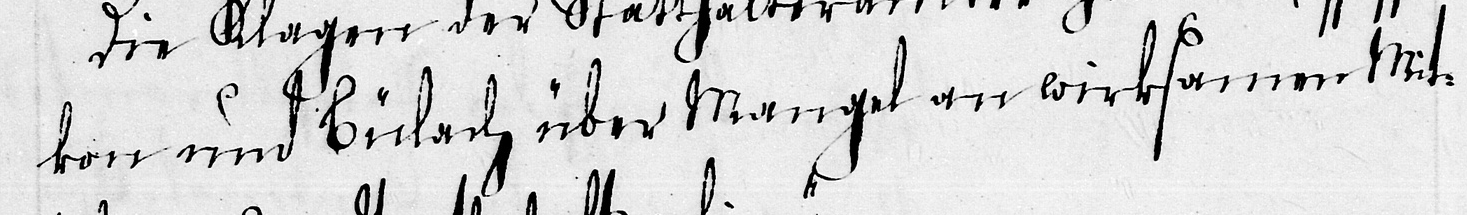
ikon und Bülach über Mangel an wirksamen Mit¬
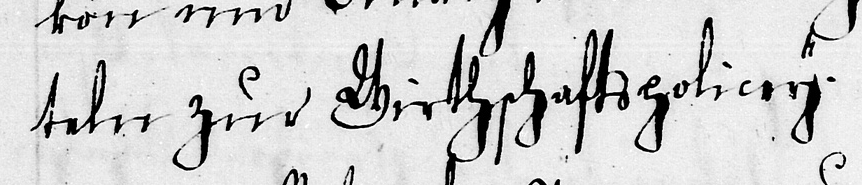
teln zur Wirthschaftspolicey.
